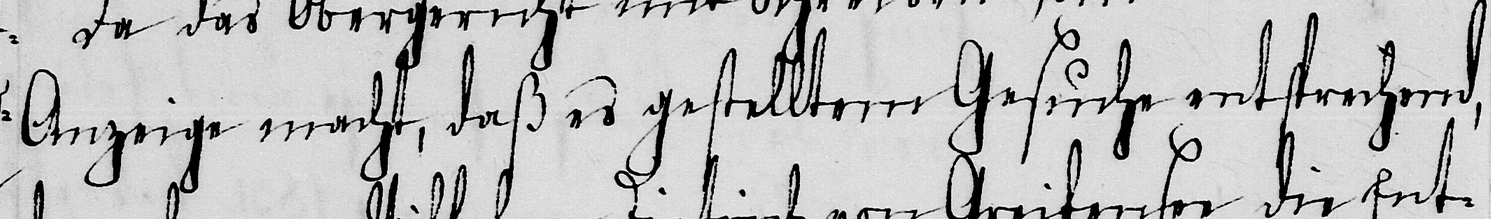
Anzeige macht, daß es gestelltem Gesuche entsprechend,
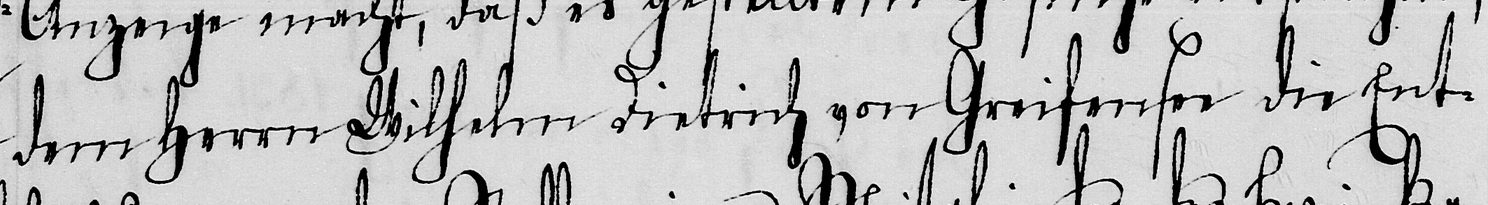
dem Herrn Wilhelm Dietrich von Greifensee die Ent¬
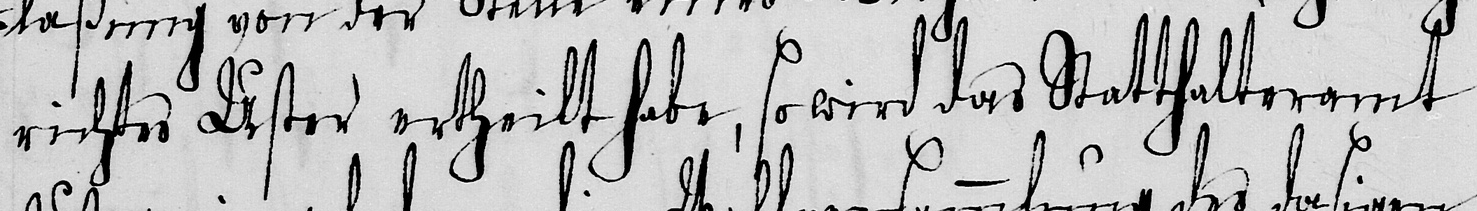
richtes Uster ertheilt habe, so wird das Statthalteramt
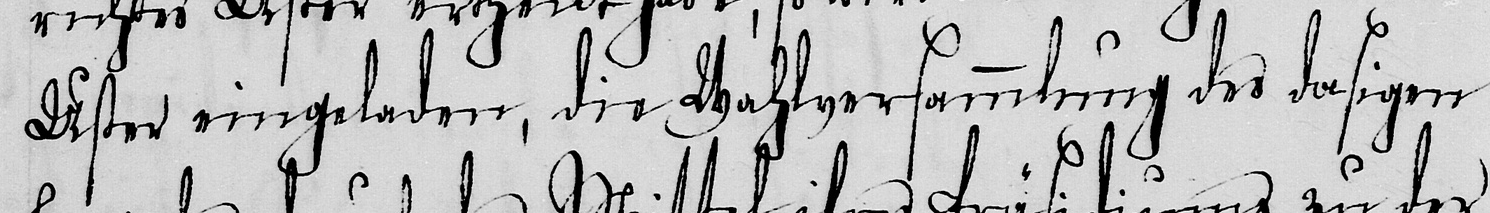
Uster eingeladen, die Wahlversammlung des dasigen
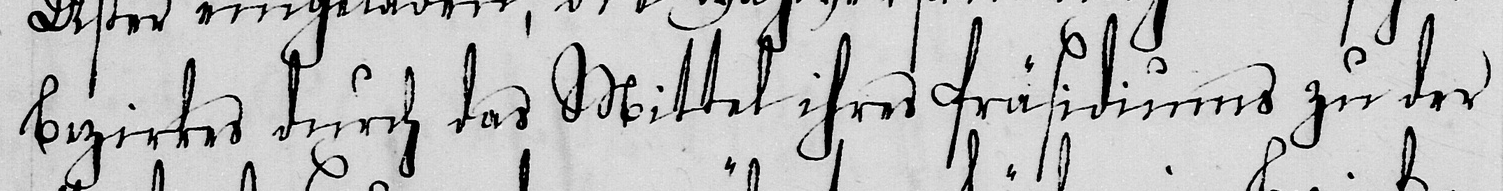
Bezirkes durch das Mittel ihres Präsidiums zu der
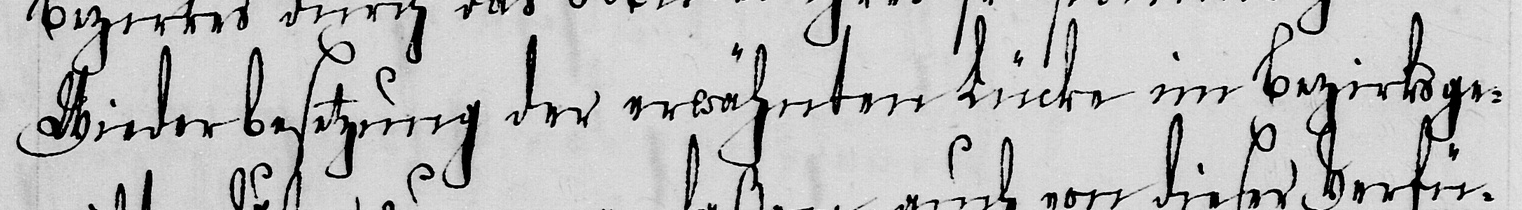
Wiederbesetzung der erwähnten Lücke im Bezirksge¬
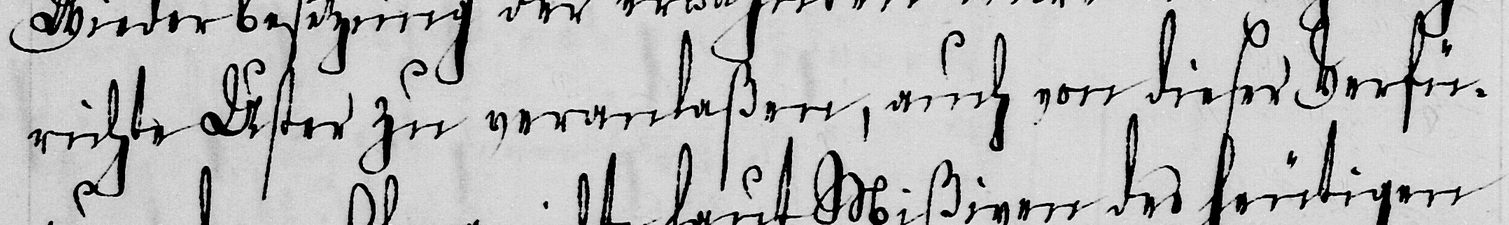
richte Uster zu veranlaßen, auch von dieser Verfü¬
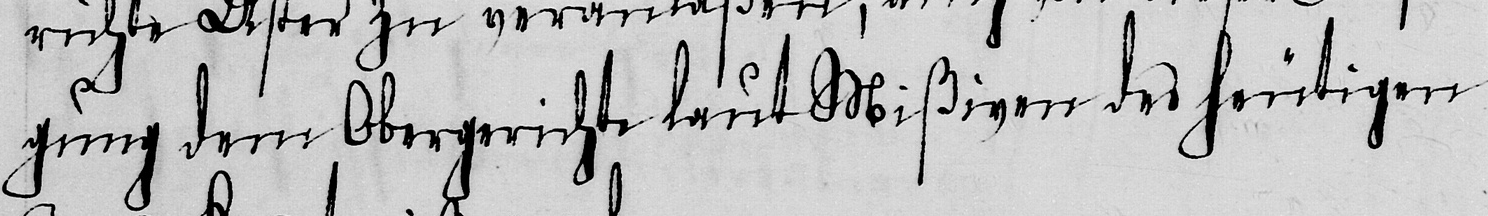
gung dem Obergerichte laut Mißiven des heutigen
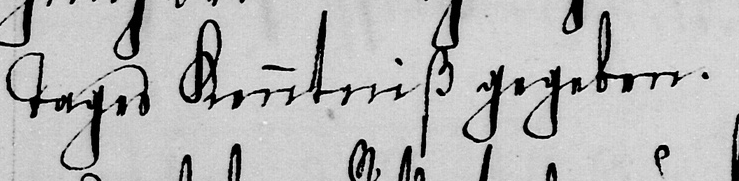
Tages Kenntniß gegeben.
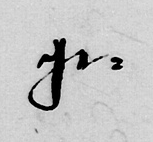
ge¬
